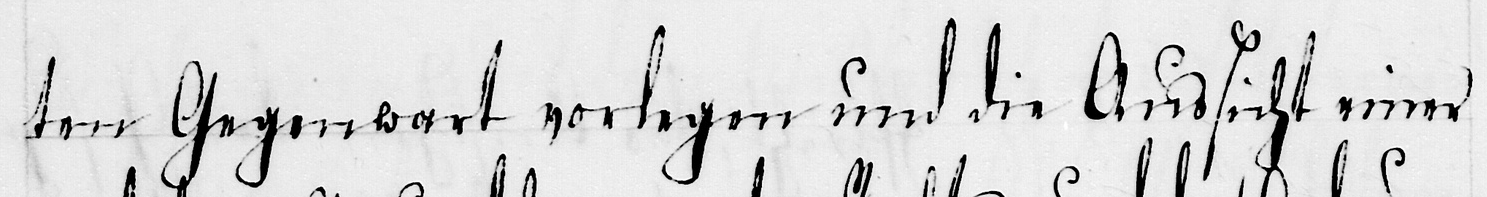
ten Gegenwart vorlegen und die Aussicht einer
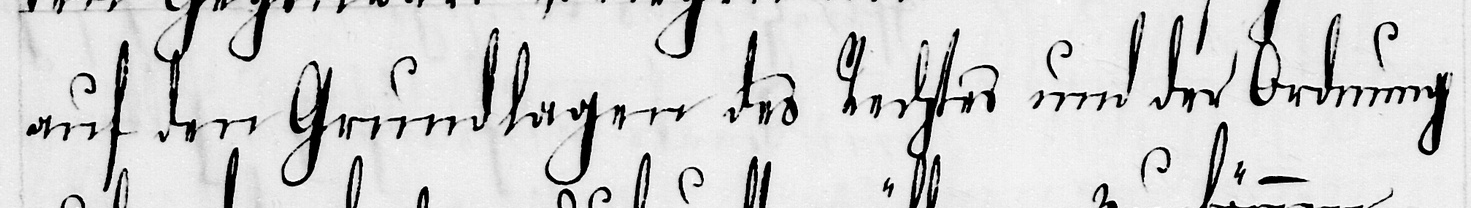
auf den Grundlagen des Rechtes und der Ordnung
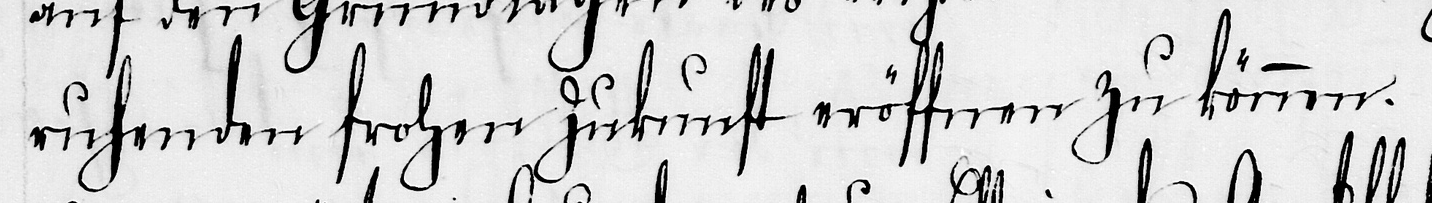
ruhenden frohen Zukunft eröffnen zu können.
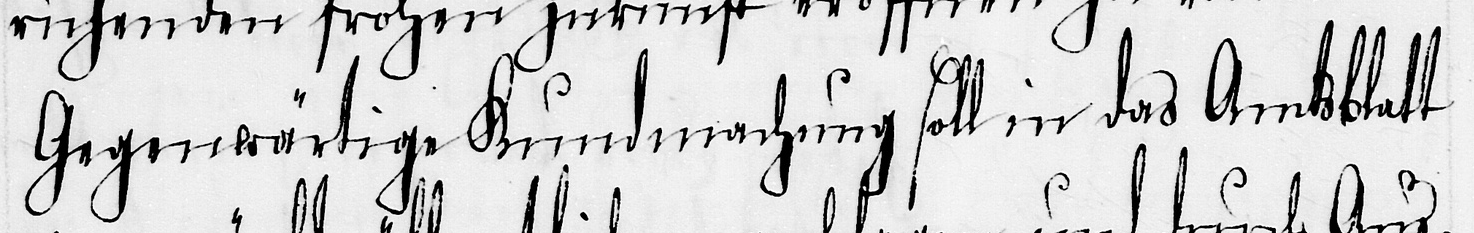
Gegenwärtige Kundmachung soll in das Amtsblatt
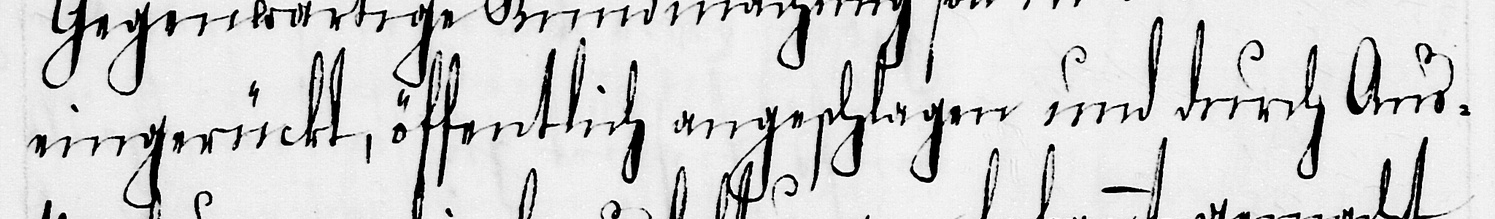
eingerückt, öffentlich angeschlagen und durch Aus¬
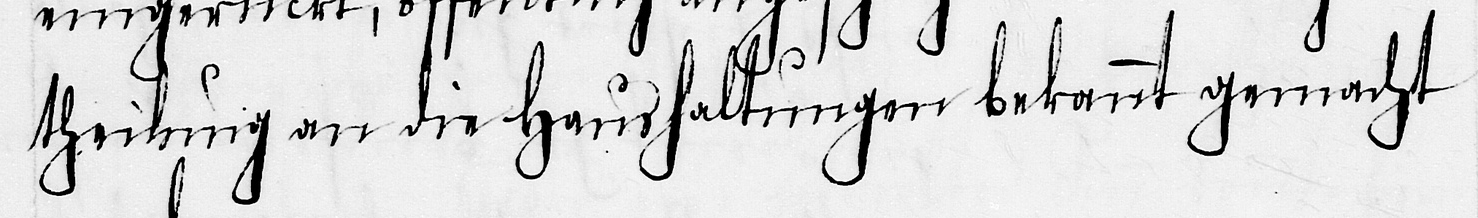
theilung an die Haushaltungen bekannt gemacht
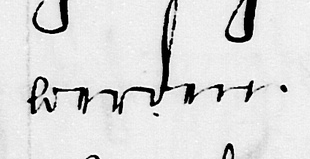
werden.
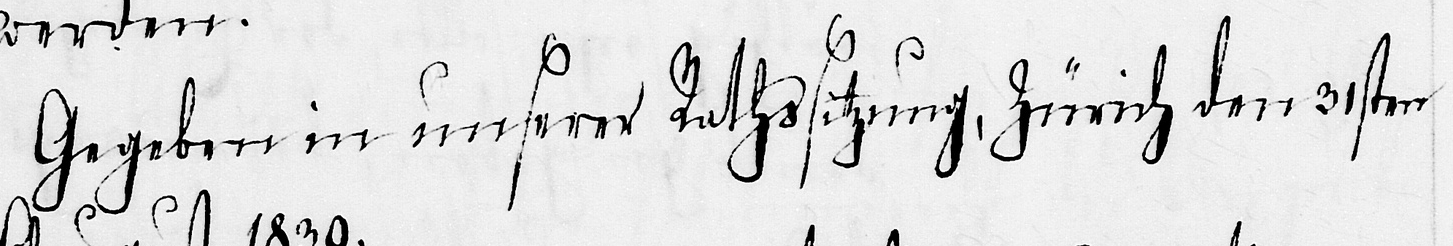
Gegeben in unserer Rathssitzung, Zürich den 31sten
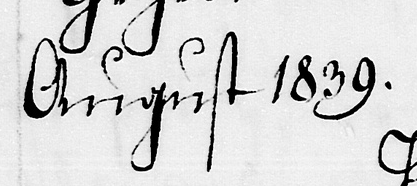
August 1839.
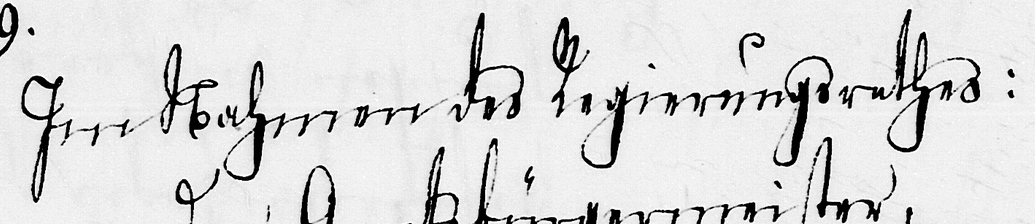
Im Nahmen des Regierungsrathes:
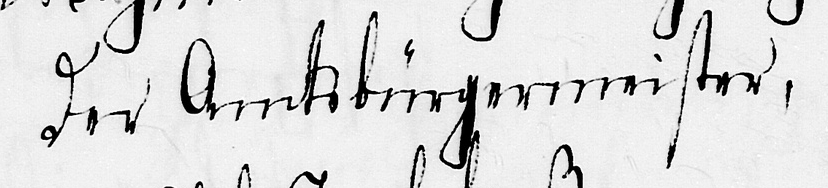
Der Amtsbürgermeister,
